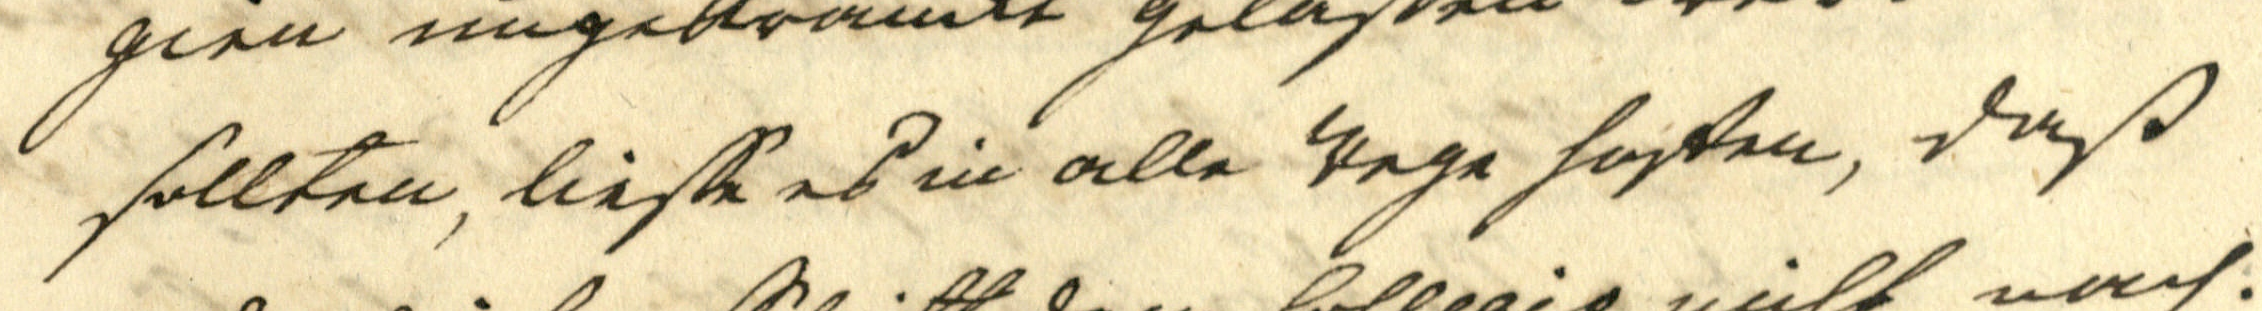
sollten, liesse es in alle Wege hoffen, daß
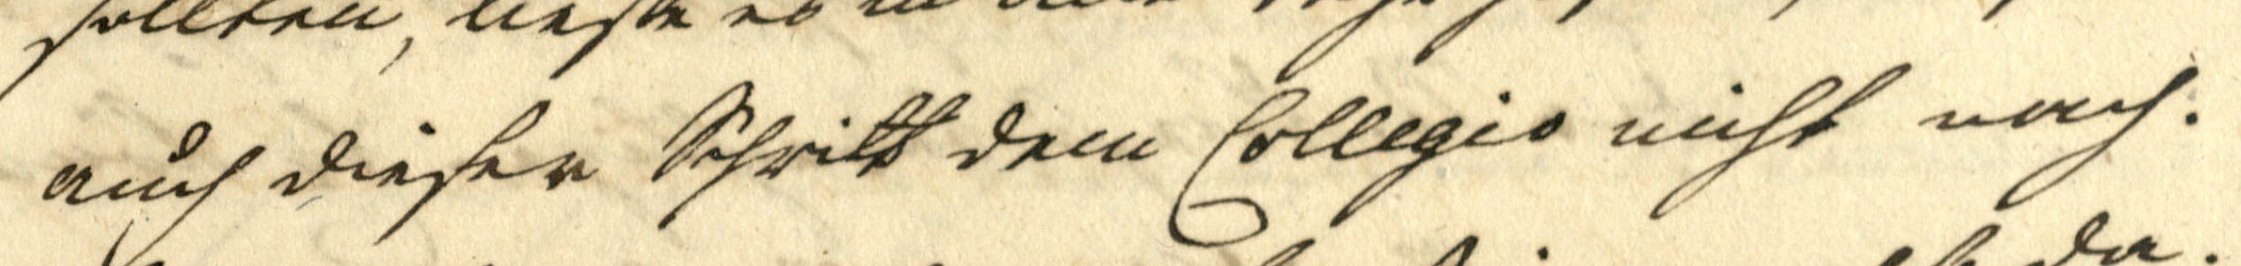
auch dieser Schritt dem Collegio nicht nach¬
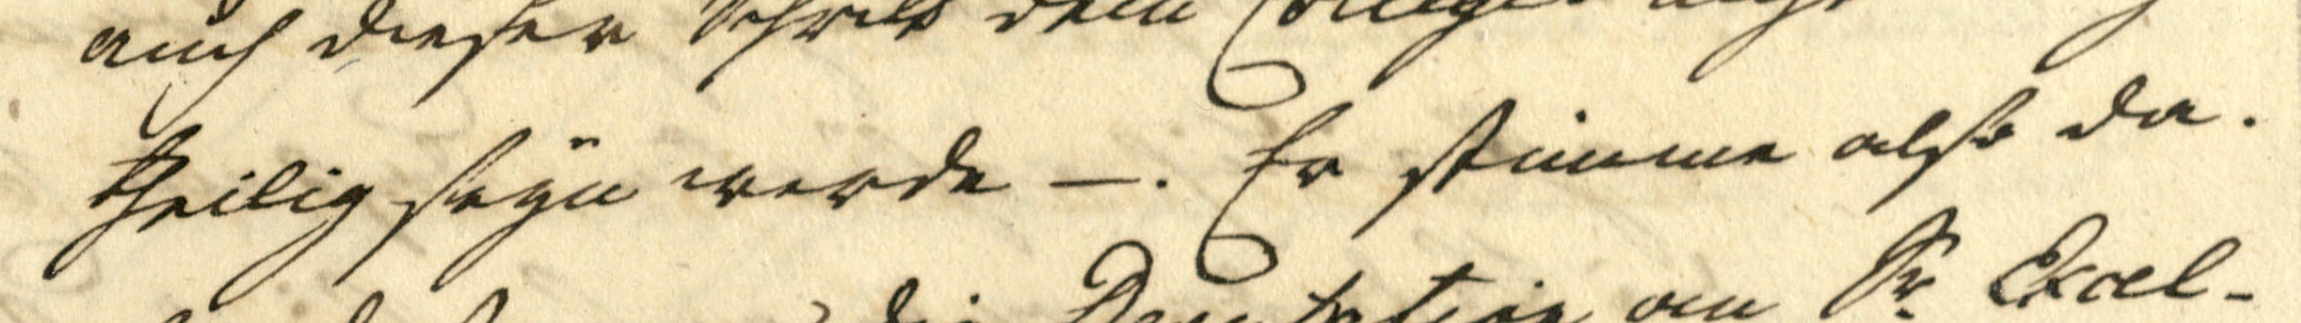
theilig seÿn werde . Er stimme also da¬
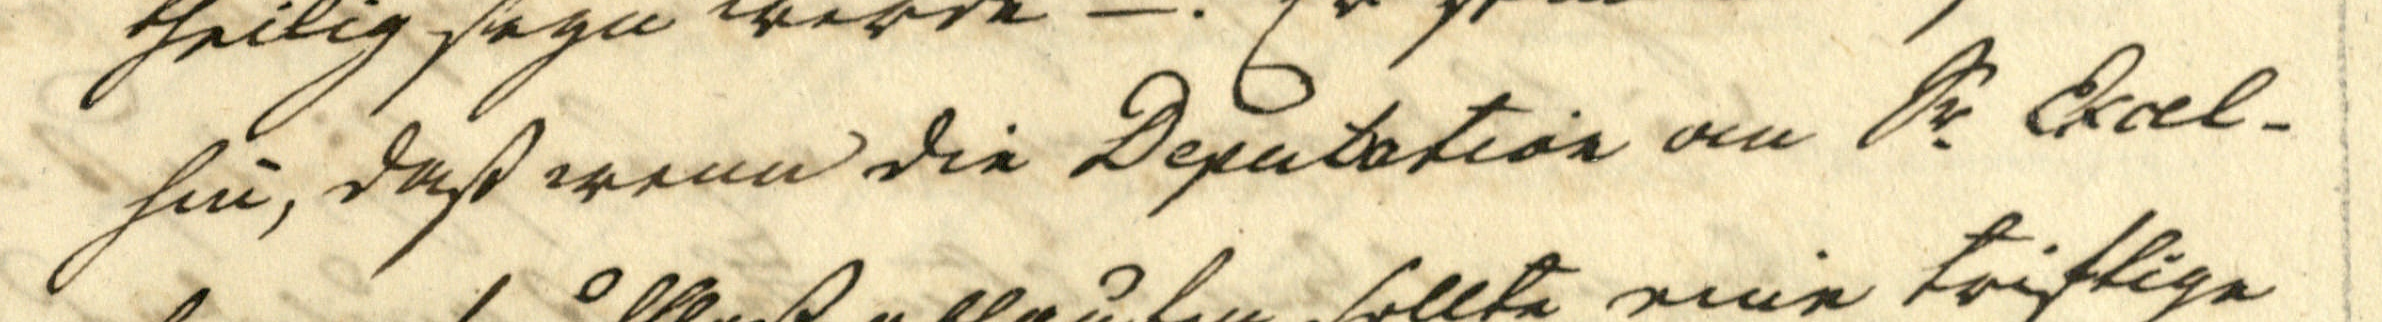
hin, daß wenn die Deputation an Sr Excel¬
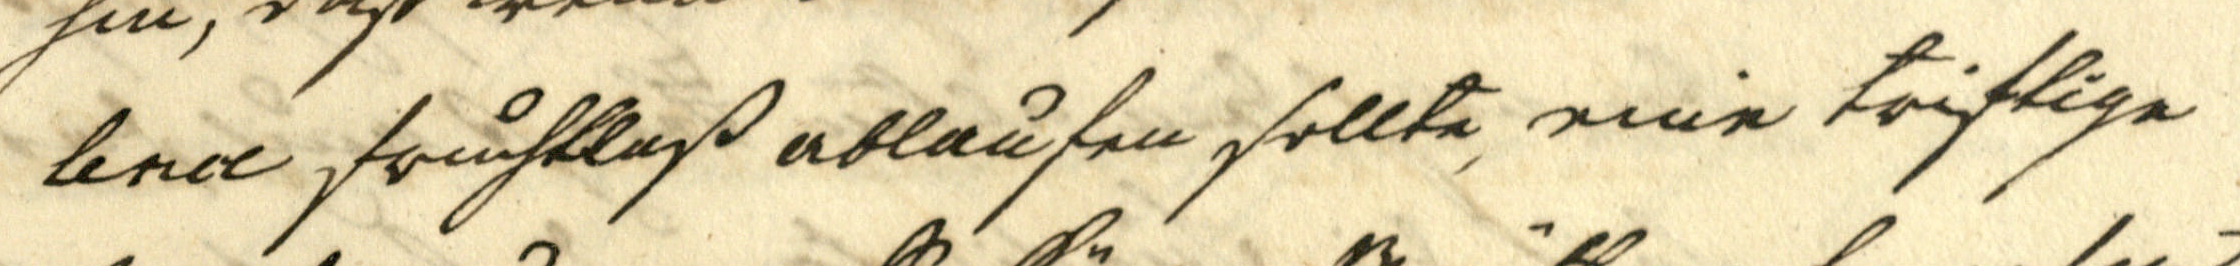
lence fruchtloß ablaufen sollte, eine triftige
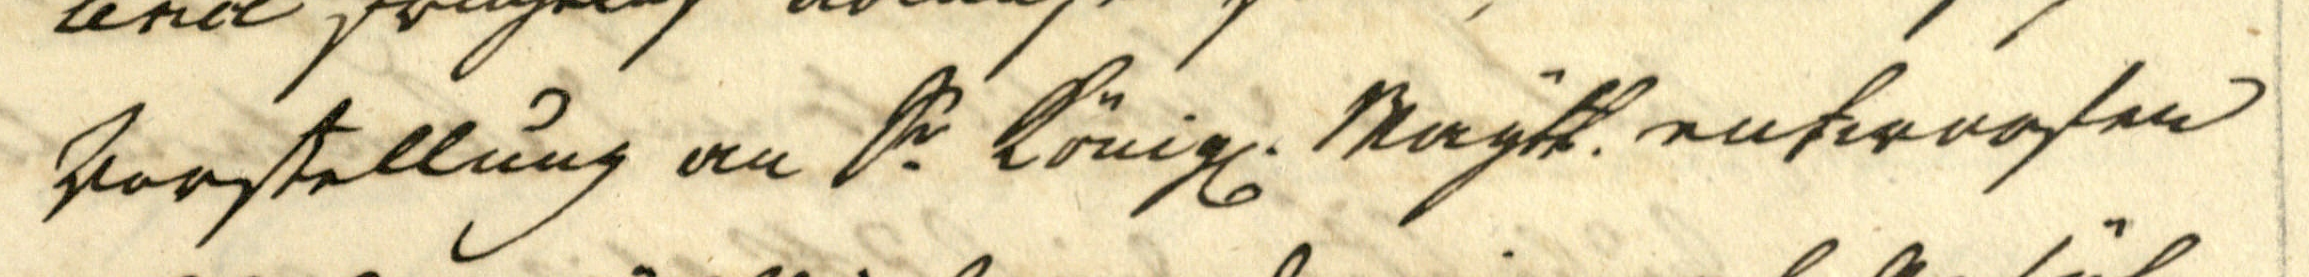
Vorstellung an Sr Königl. Maÿtt. entworfen
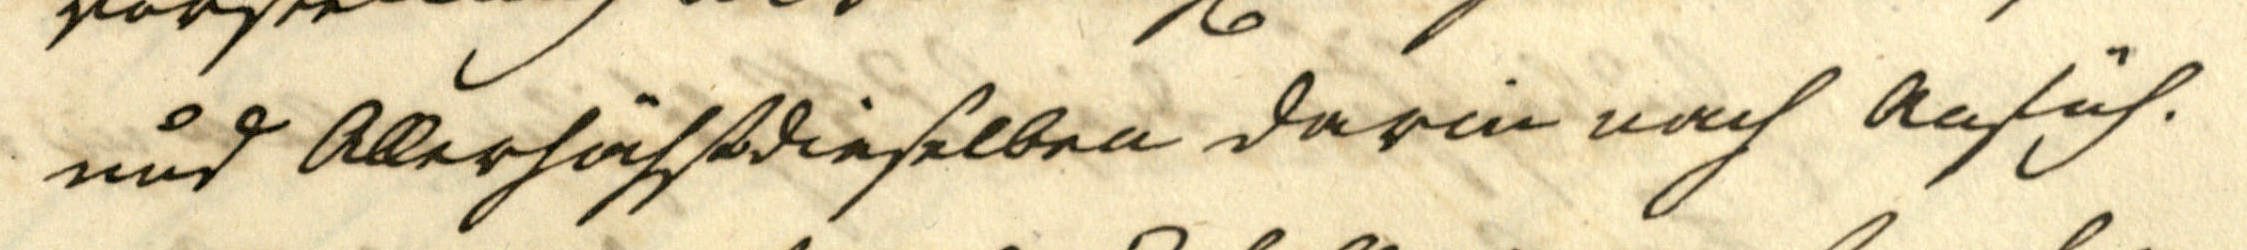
und Allerhöchstdieselben darin nach Anfüh¬
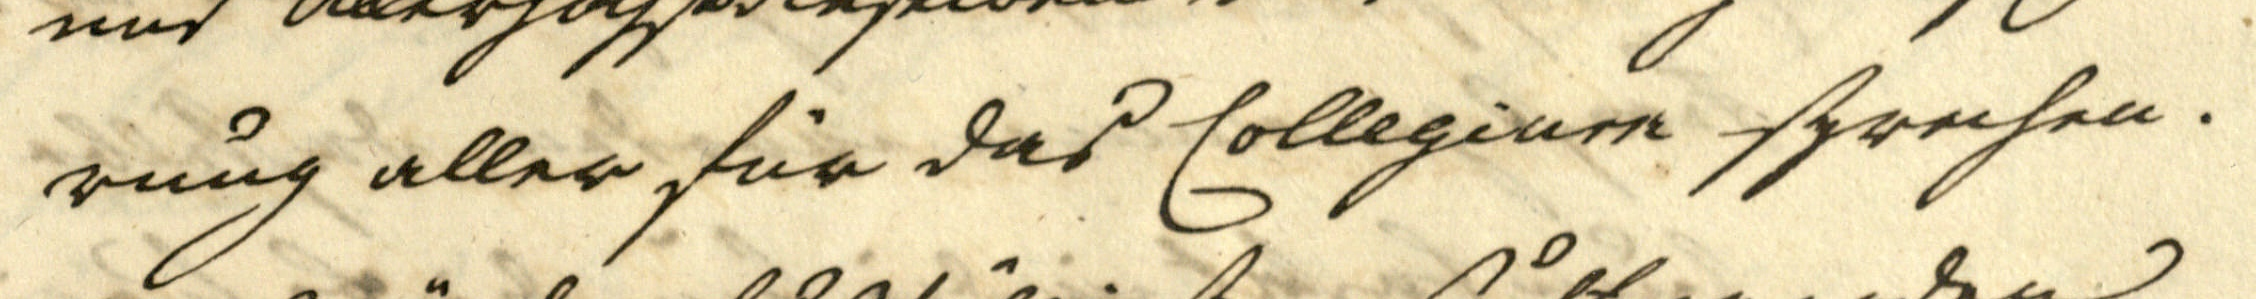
rung aller für das Collegium sprechen¬
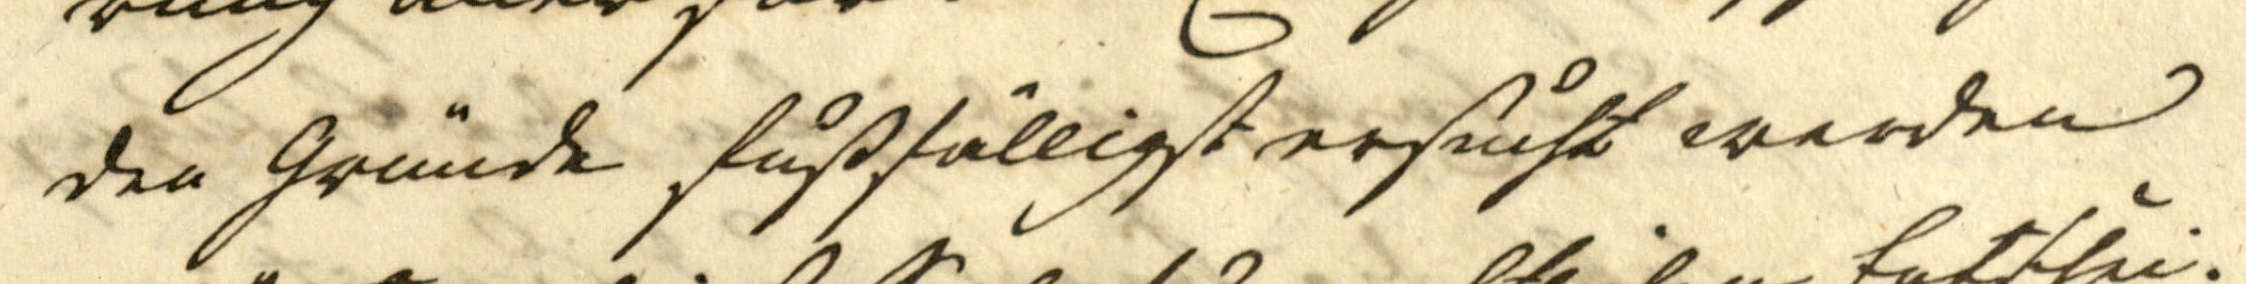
den Gründe zu fußfälligst ersucht werden
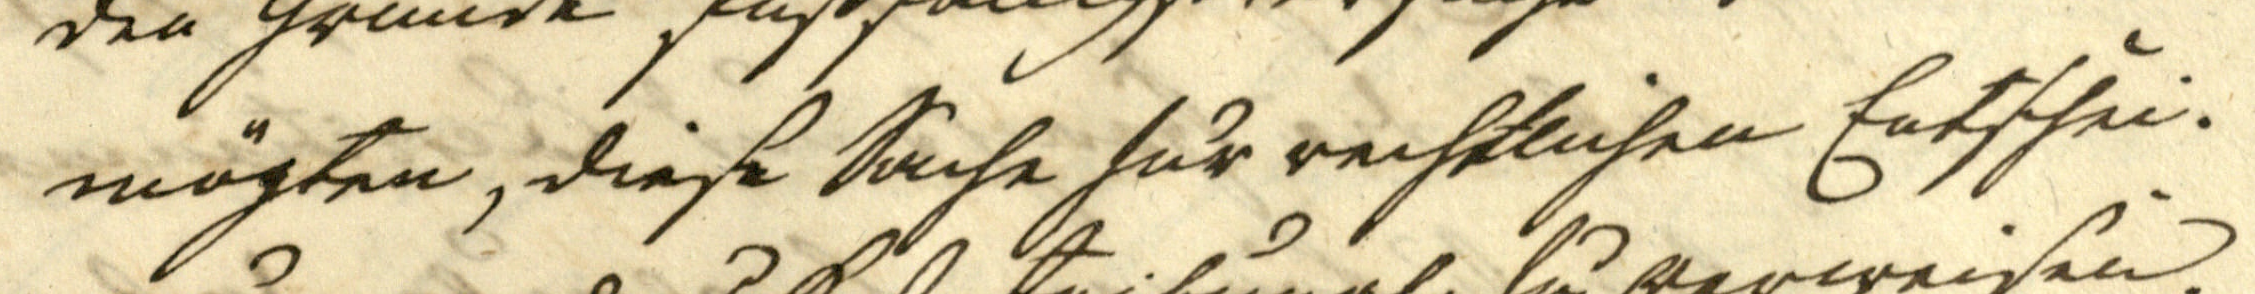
mögten, diese Sache zur rechtlichen Entschei¬
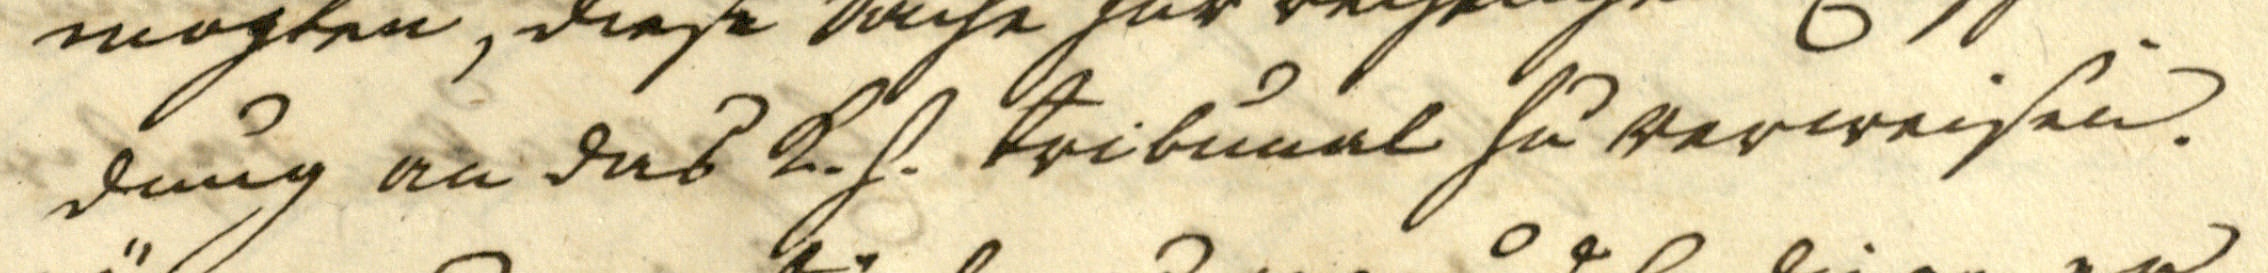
dung an das K. H. Tribunal zu verweisen.
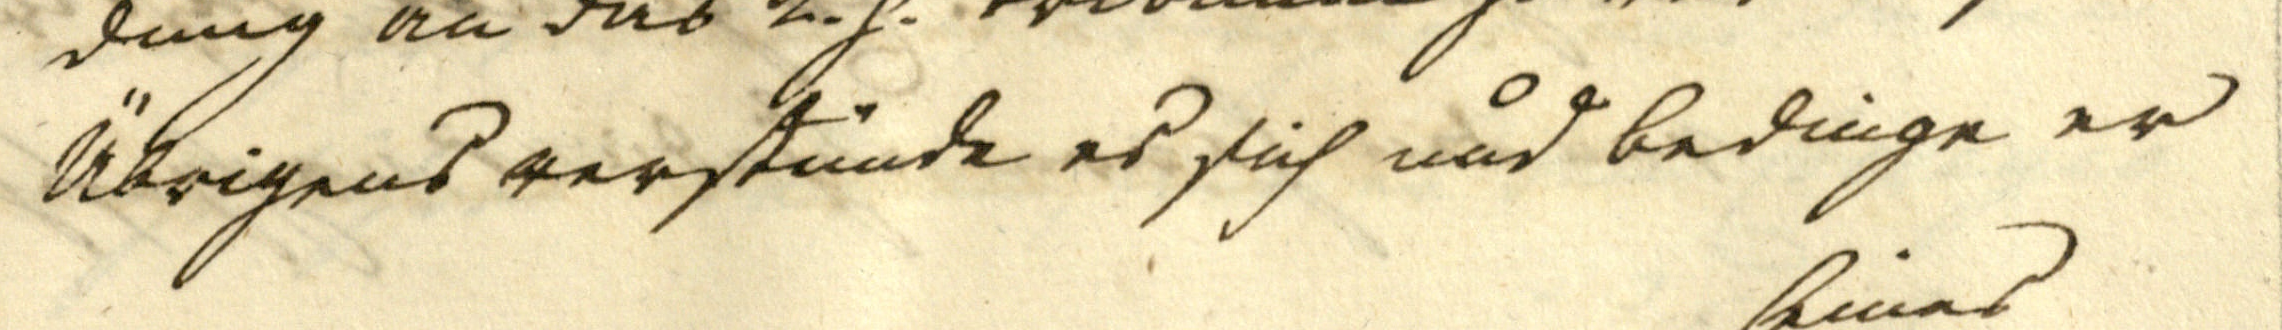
Übrigens verstünde es sich und bedinge er
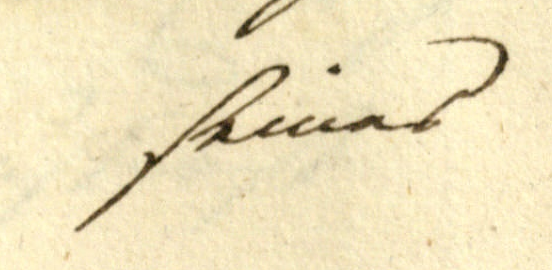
seines
